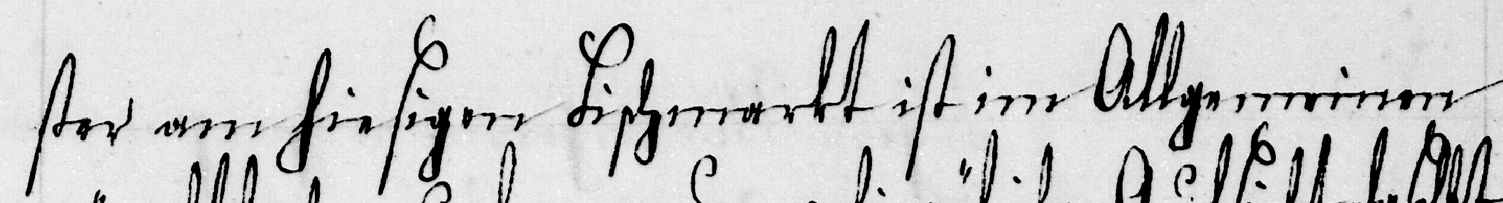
ster am hiesigen Fischmarkt ist im Allgemeinen
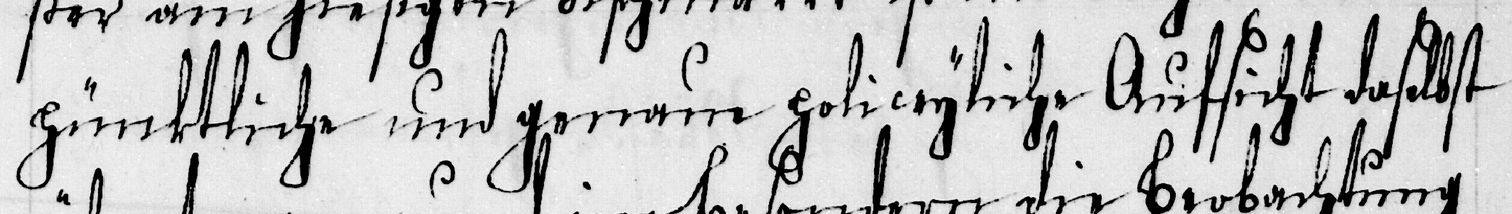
pünktliche und genaue policeyliche Aufsicht dasel¬
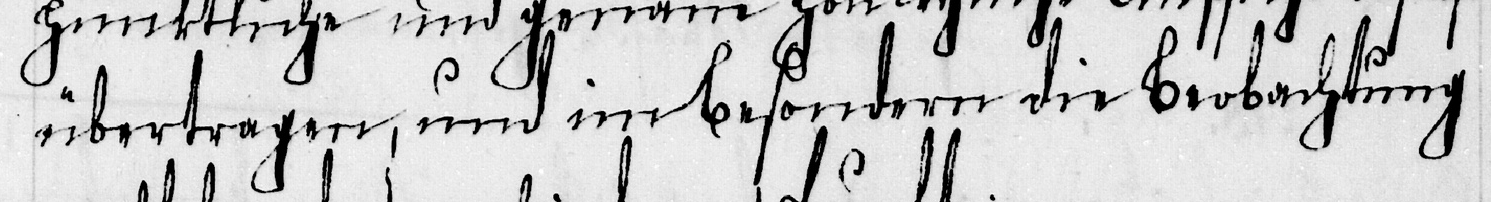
übertragen, und im Besondern die Beobachtung
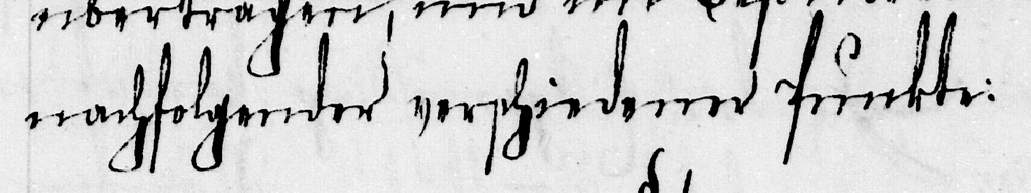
nachfolgender verschiedener Punkte:
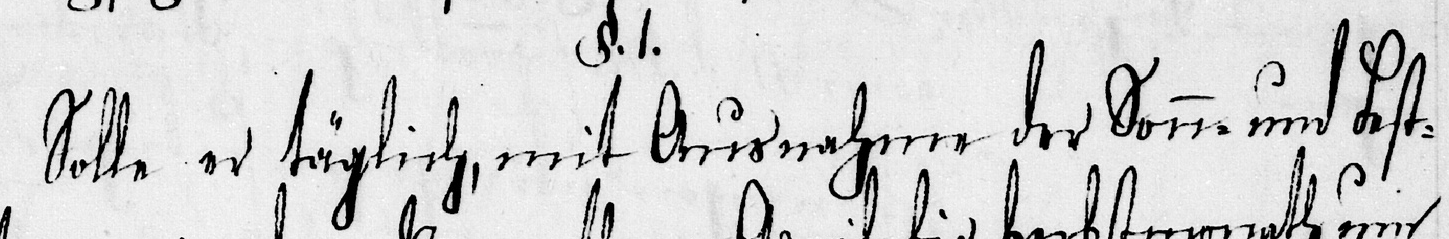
Solle er täglich, mit Ausnahme der Sonn- und Fes¬
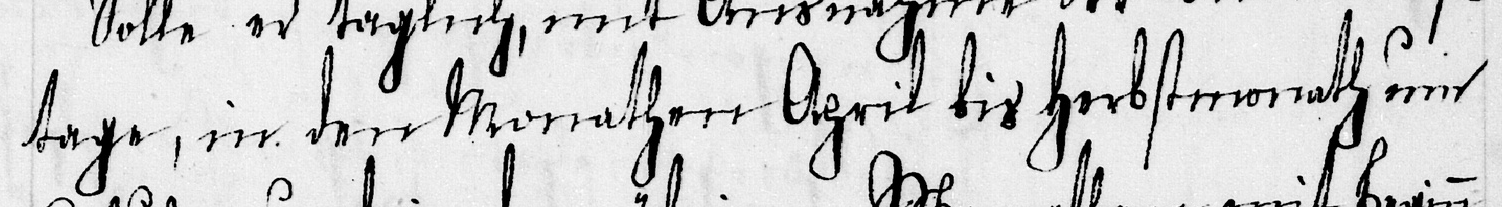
tage, in den Monathen April bis Herbstmonath um
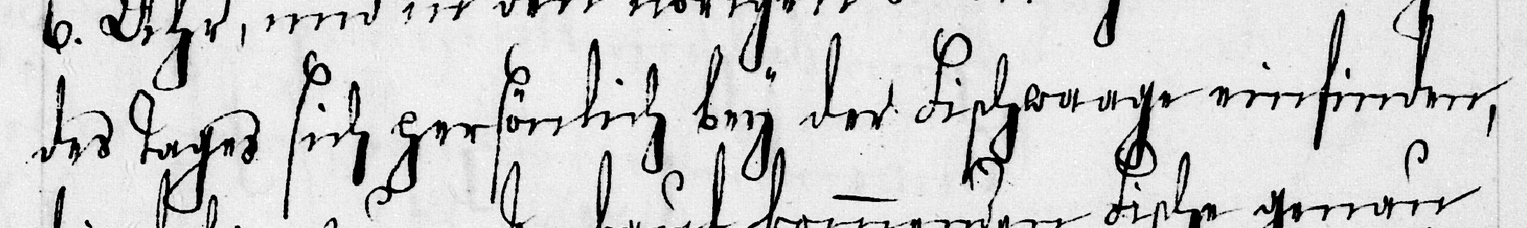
des Tages sich persönlich bey der Fischwaage einfinden,
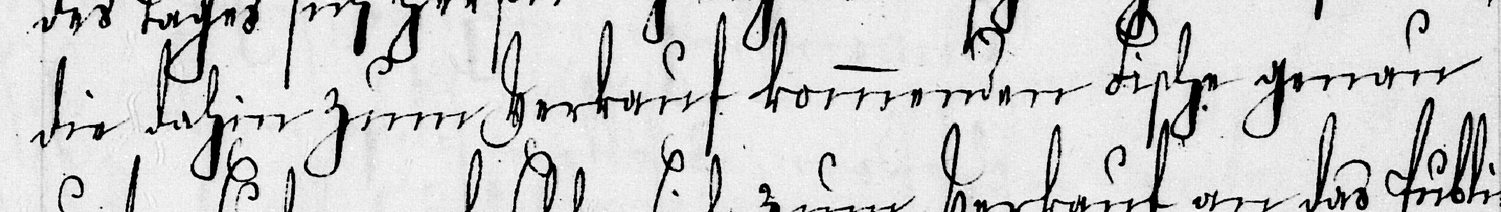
die dahin zum Verkauf kommenden Fische genau
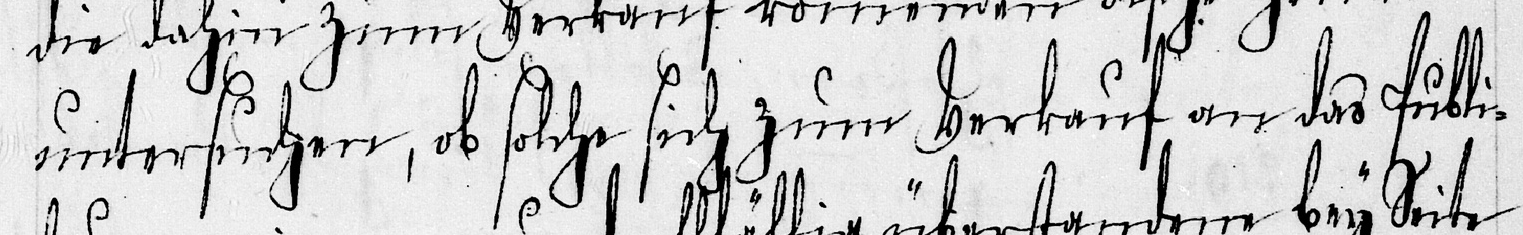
untersuchen, ob solche sich zum Verkauf an das Publi¬
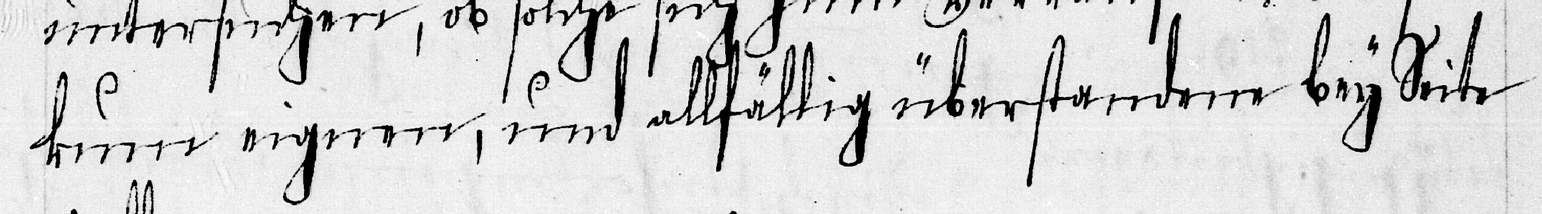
kum eignen, und allfällig überstandene bey Seite
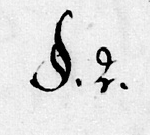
§. 2.
